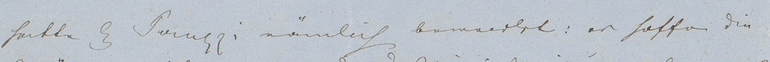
hatte Herr Peruzzi nämlich bemerkt: er hoffe die
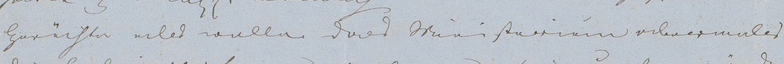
Gerüchte als wolle das Ministerium abermals
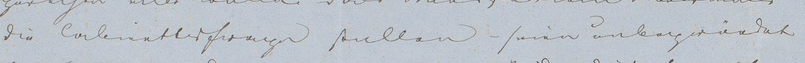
die Cabinettsfrage stellen – seien unbegründet
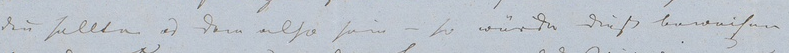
denn sollte es dem also sein – so würde dieß beweisen
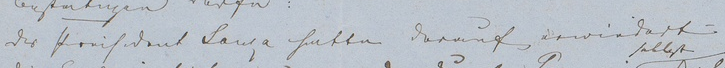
Der Präsident Lanza hatte darauf erwiedert –
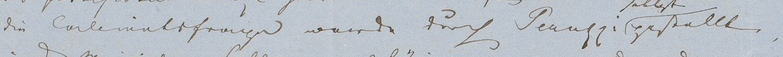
die Cabinetsfrage werde durch Peruzziselbst gestellt,
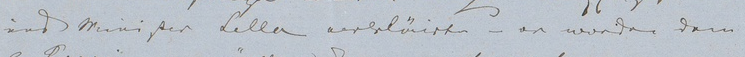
und Minister Sella erklärte – er werde dem
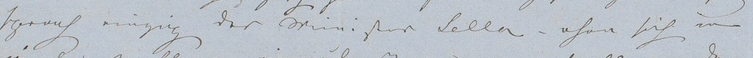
sprach einzig der Minister Sella – ohne sich in
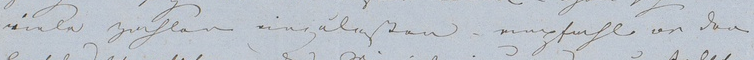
viele Zahlen einzulaßen – empfahl er den
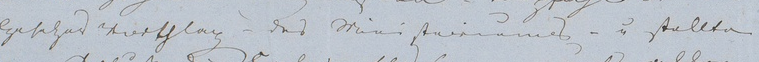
Gesetzes Vorschlag – des Ministeriums – u stellte
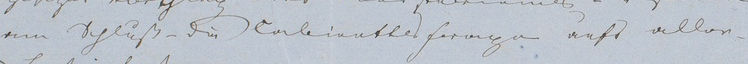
am Schluß – die Cabinetts Frage aufs aller-
